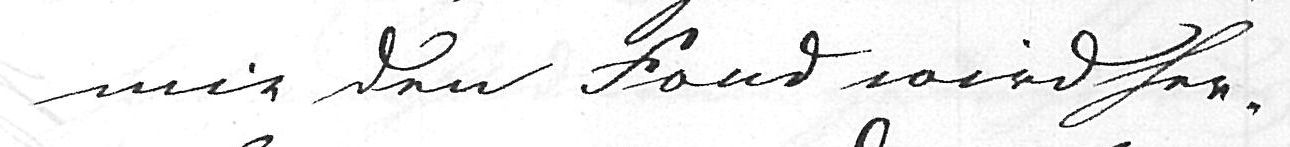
mie den Fond wird her-
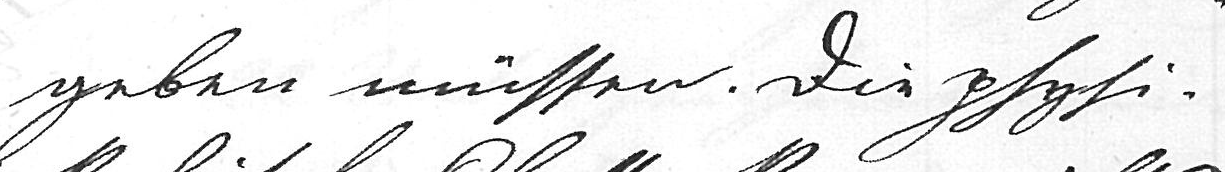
geben müssen. Die physi-
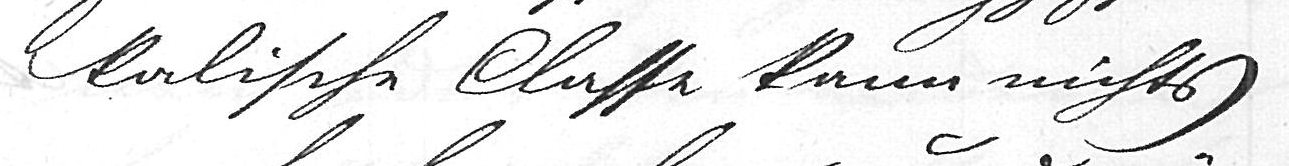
kalische Classe kann nichts
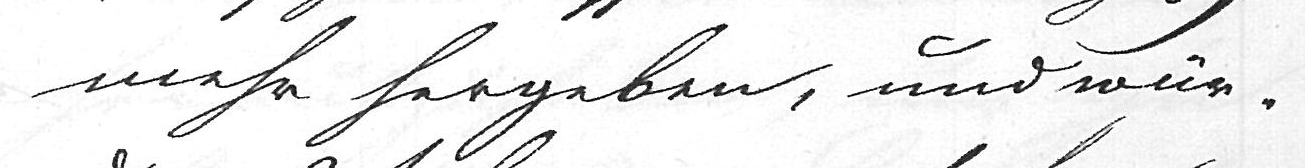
mehr hergeben, und wür-
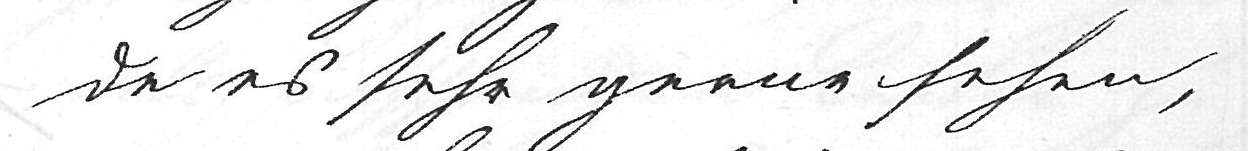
de es sehr gerne sehen,
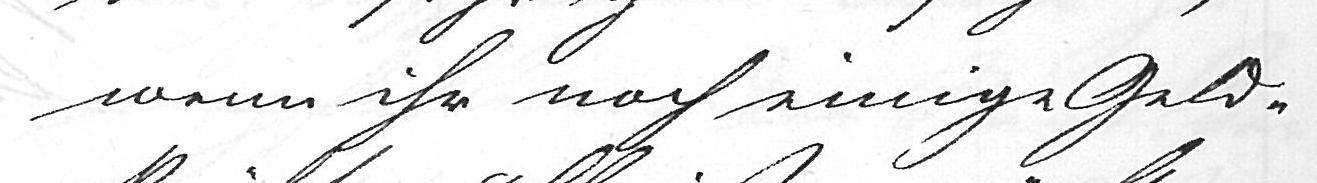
wenn ihr noch einige Geld-
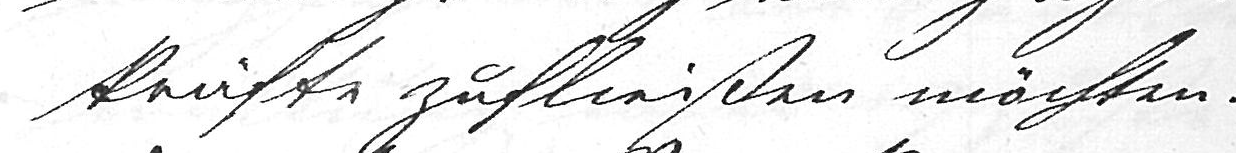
kräfte zufließen möchten.
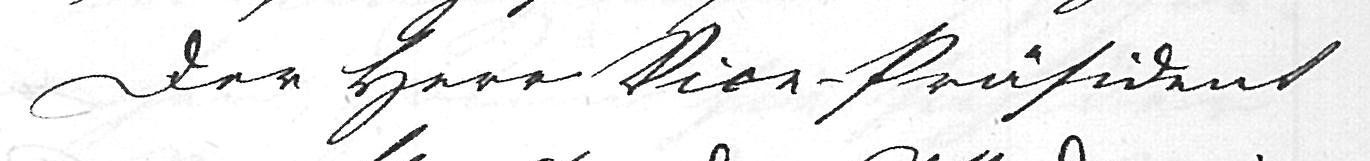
Der Herrn Vice-Präsident
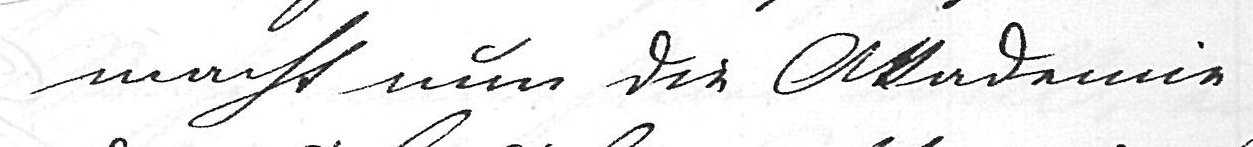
macht nun die Akademie
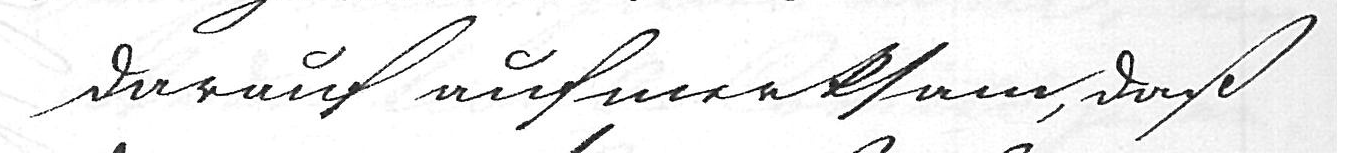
darauf aufmerksam, daß
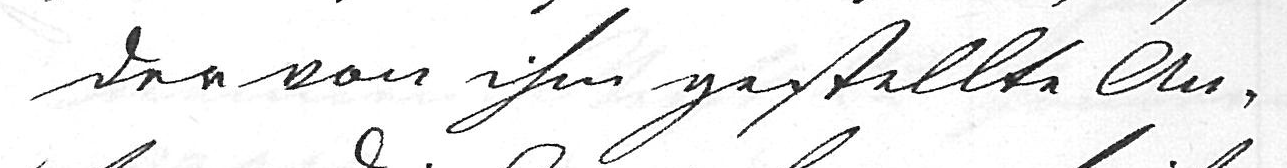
der von ihm gestellte An-
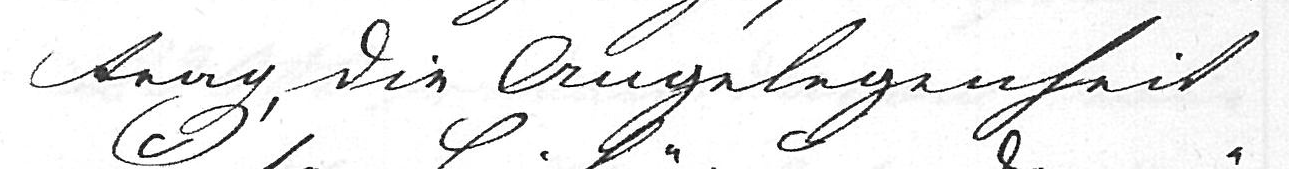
trag die Angelegenheit
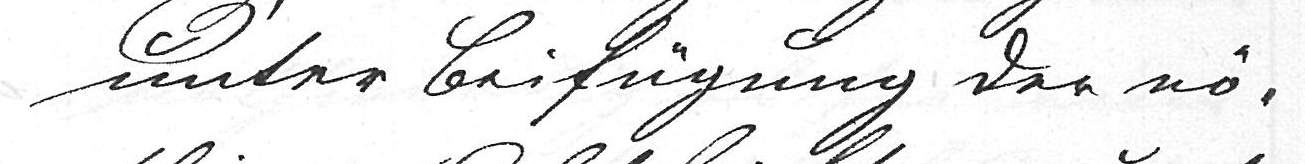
unter Beifügung der nö-
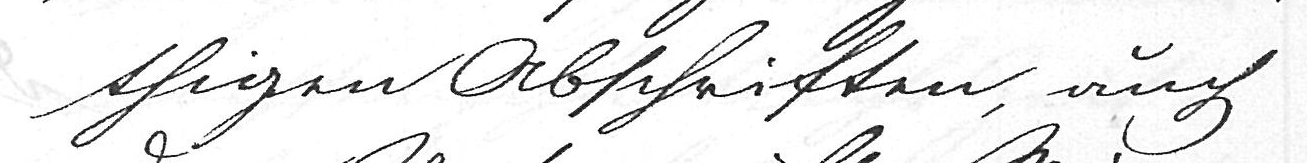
thigen Abschriften, auch
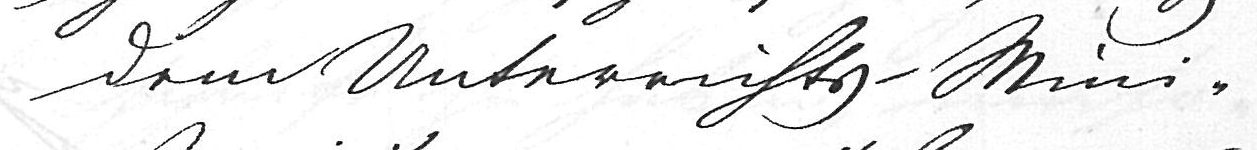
dem Unterrichts-Mini-
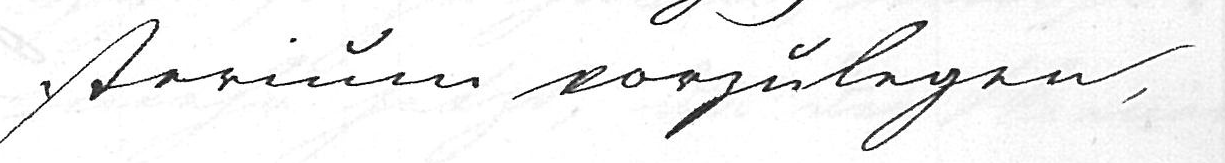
sterium vorzulegen,
